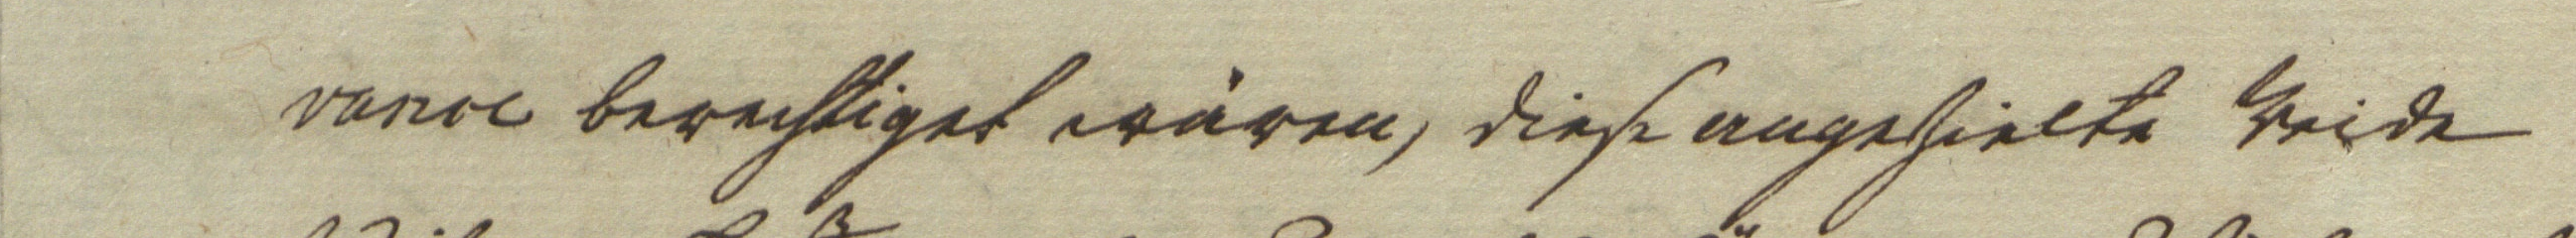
vance berechtiget wären, diese angezielte Weide
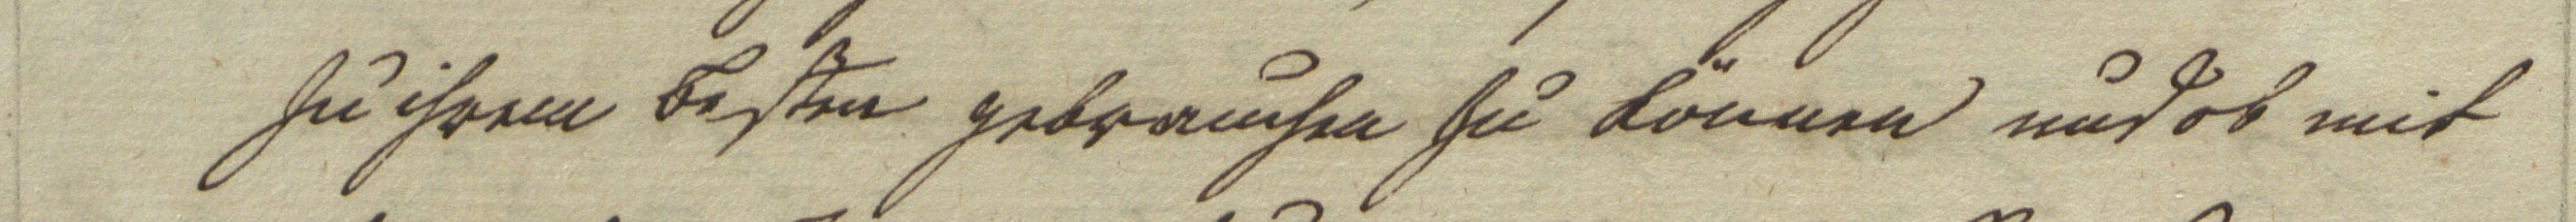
zu ihrem Besten gebrauchen zu können und ob mit
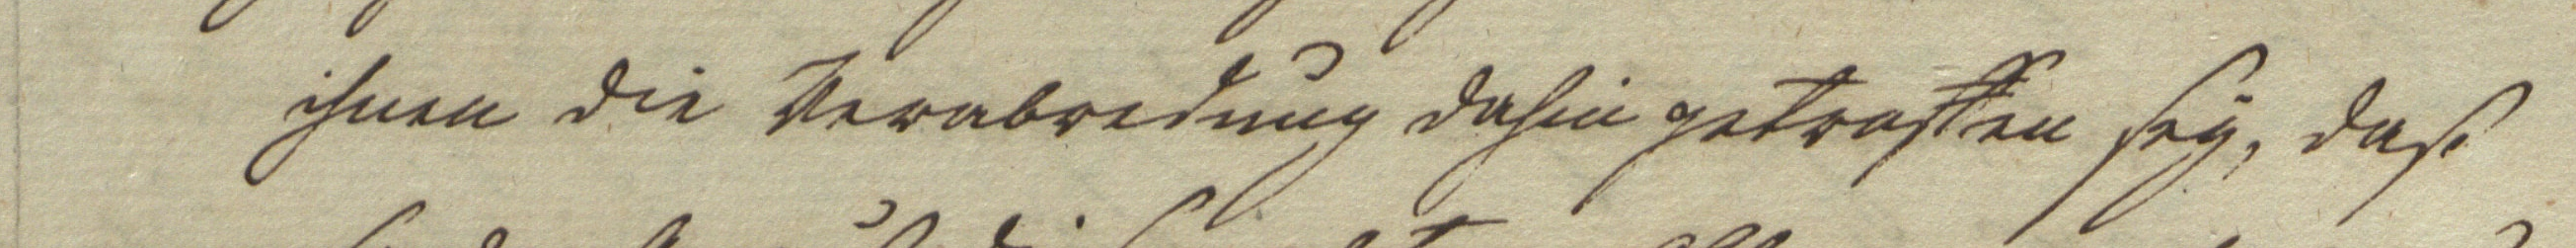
ihnen die Verabredung dahin getroffen sey, daß
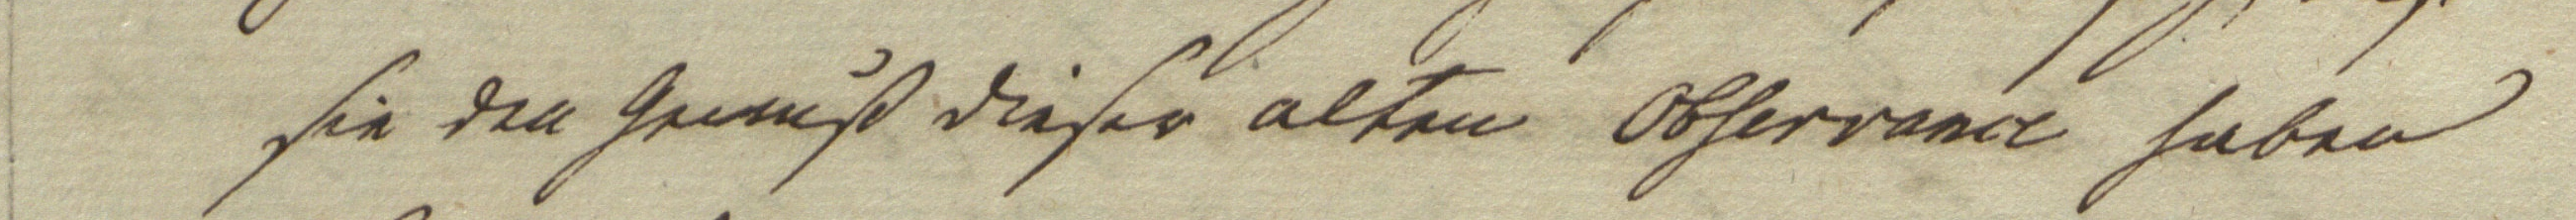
sie den Genuß dieser alten Observance haben
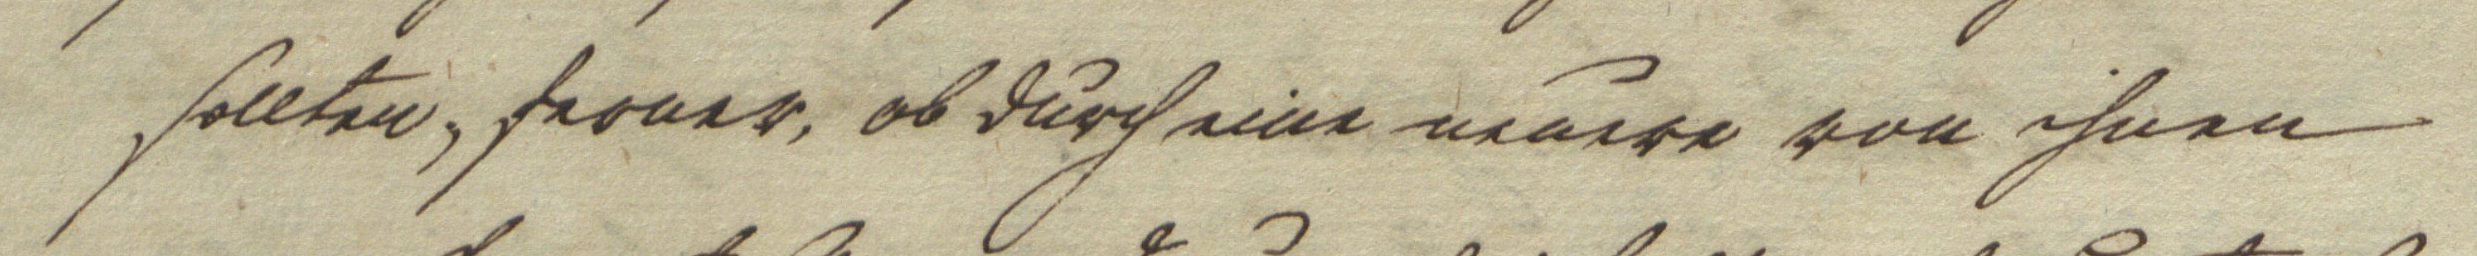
sollten, ferner, ob durch eine neuere von ihnen
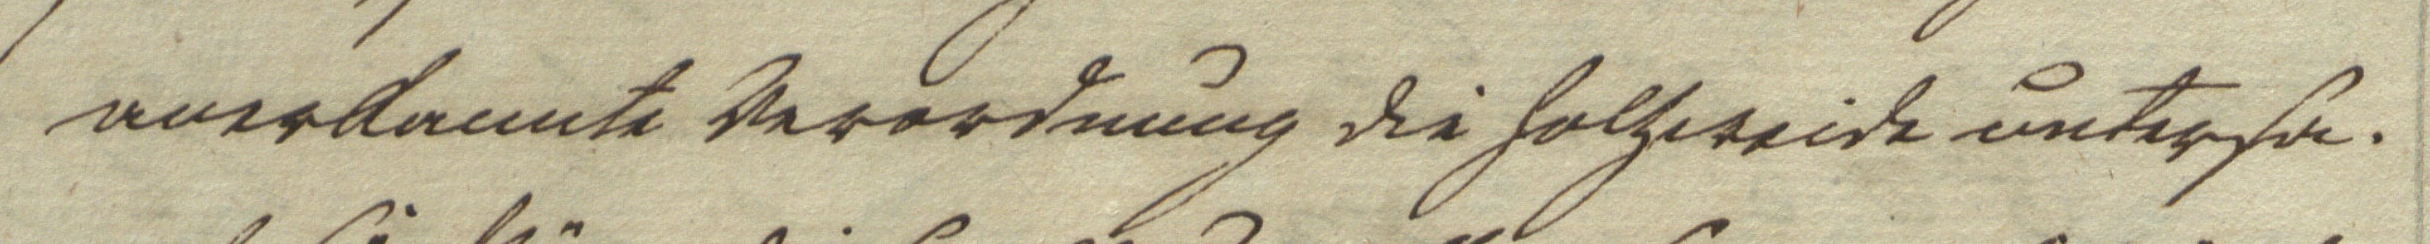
anerkannte Verordnung die Holzweide untersa¬
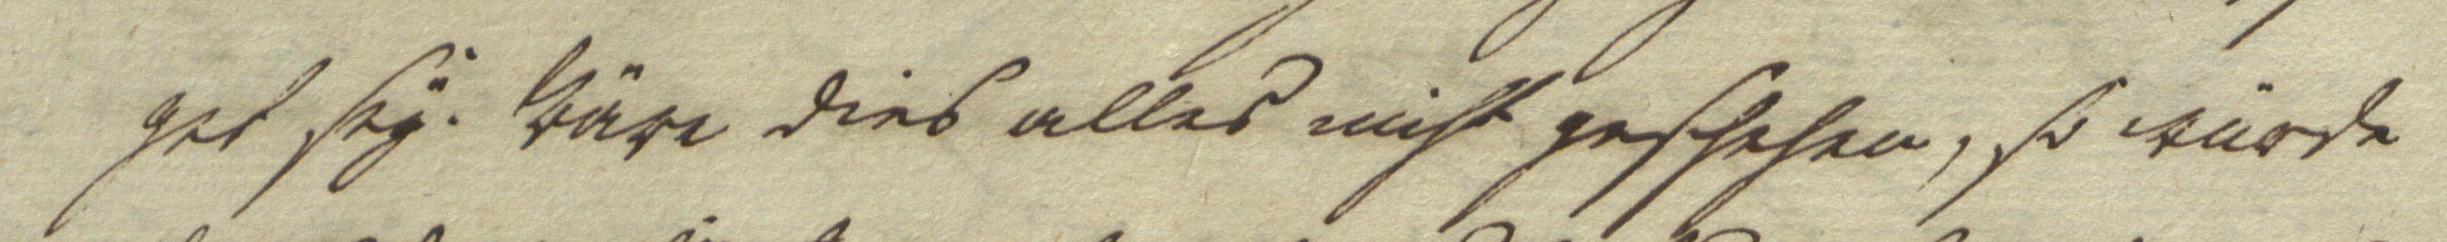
get sey. Wäre dies alles nicht geschehen, so würde
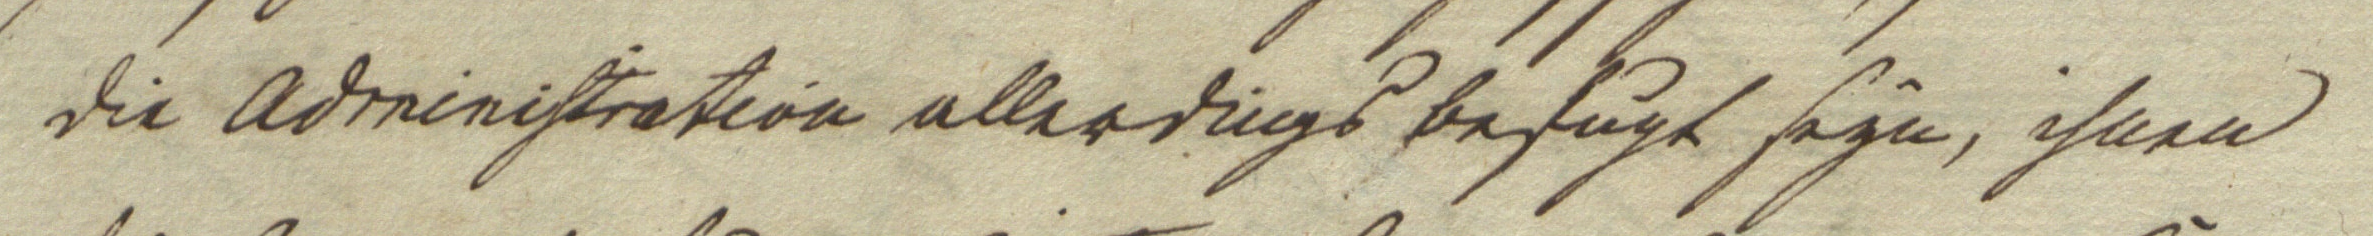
die Administraion allerdings befugt seyn, ihnen
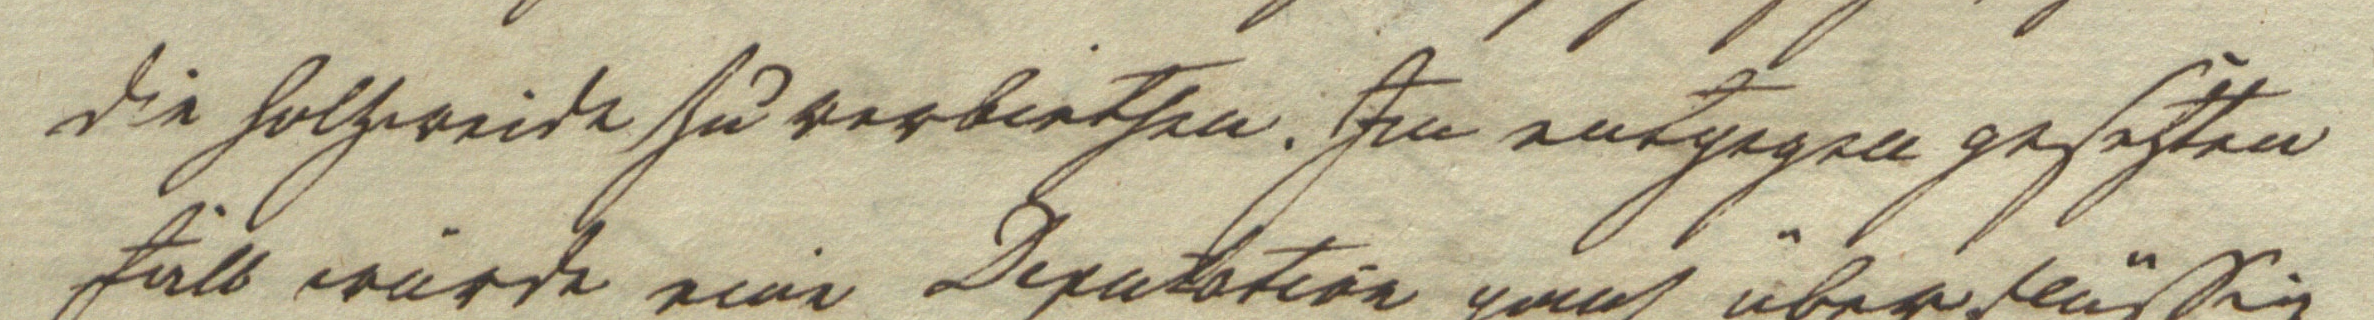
die Holzweide zu verbiethen. Im entgegen gesetzten
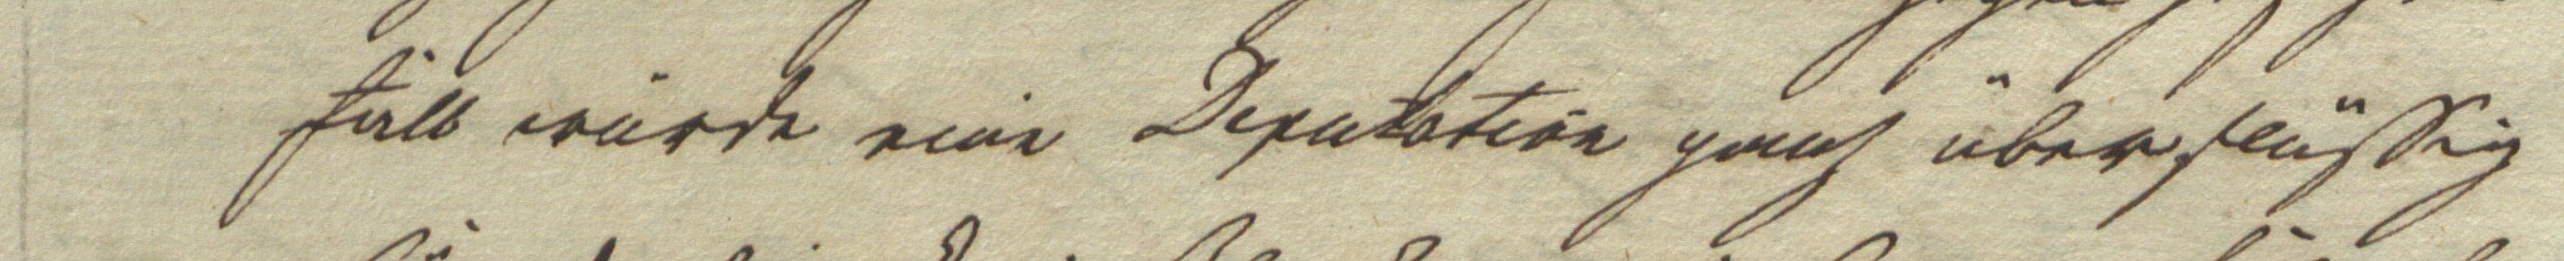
Fall würde eine Deputation ganz überflüssig
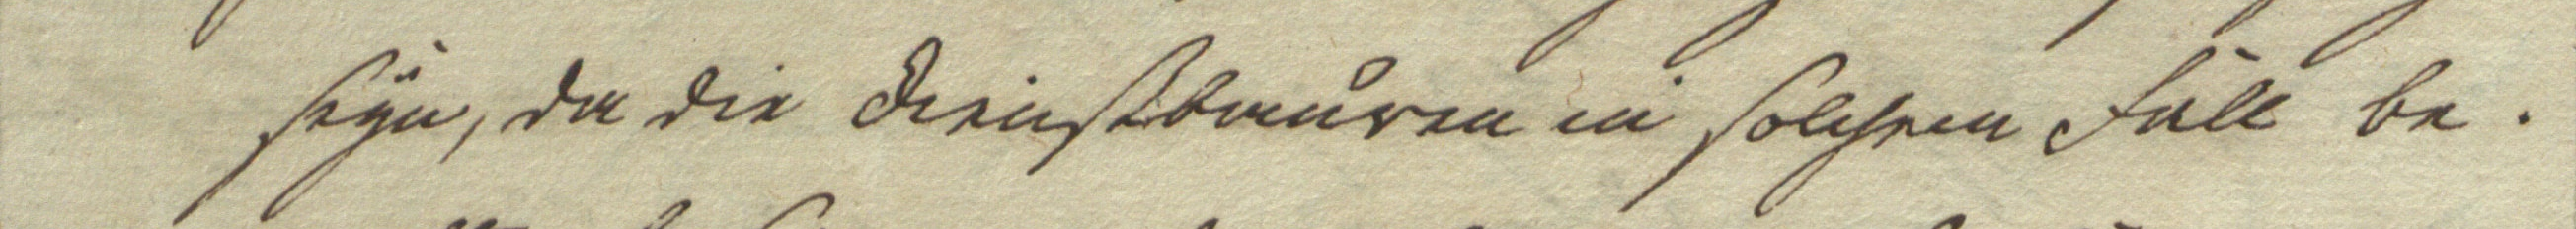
seyn, da die Dienstbauren in solchem Fall be¬
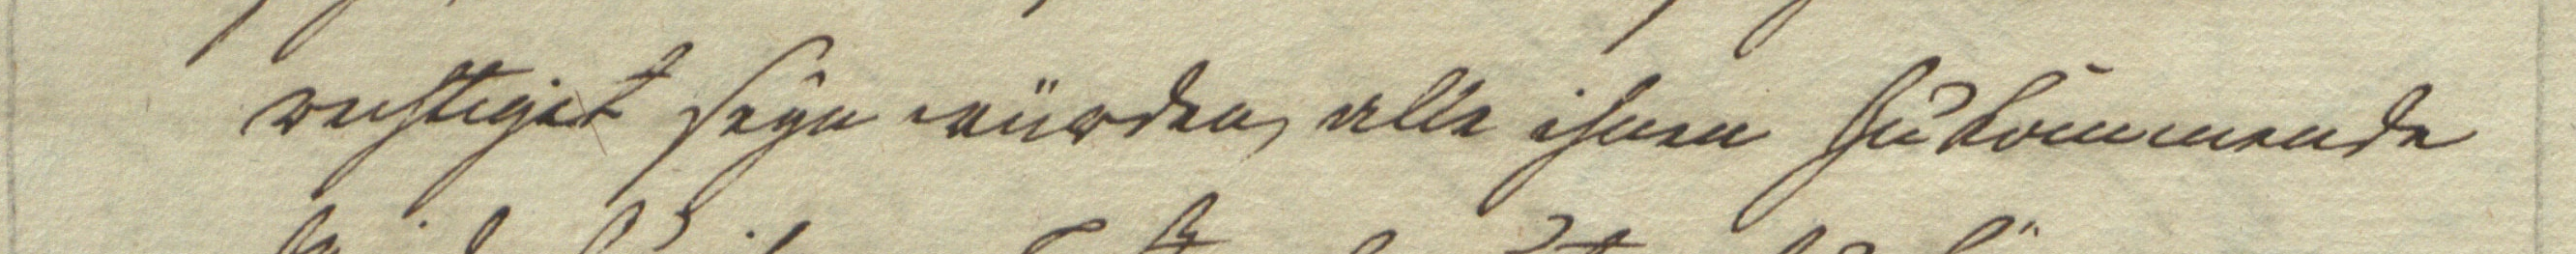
rechtiget seyn würden, alle ihnen zu kommende
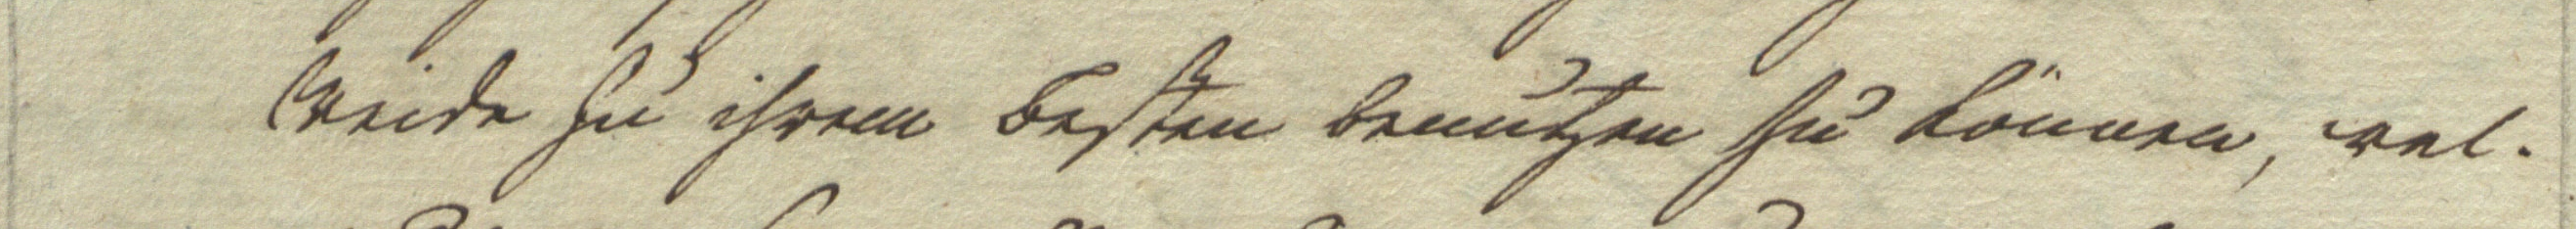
Weide zu ihrem Besten benutzen zu können, wel¬
